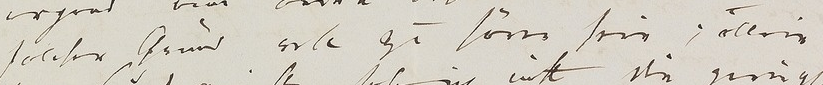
solcher Grund wohl zu hören sein; allein
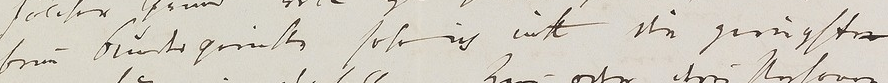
beim Bundesgerichte sehe ich nicht die geringste
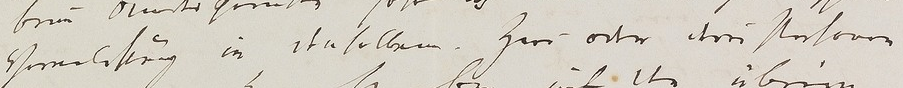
Veranlassung in denselben. Zwei oder drei Personen
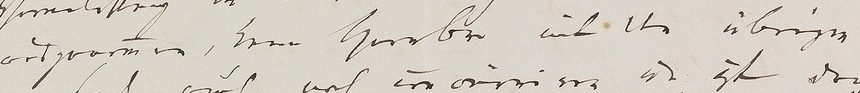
ausgenommen, kann Herr Br mit den übrigen
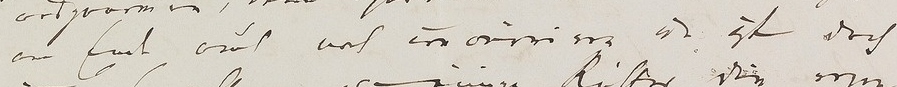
am Ende auch noch concurriren u. ist doch
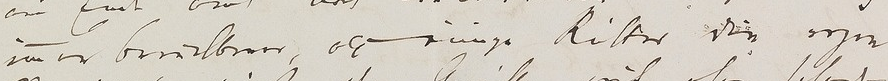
immer brauchbarer, als einige Richter die wegen
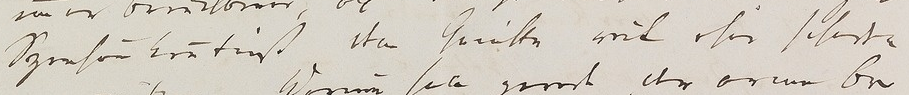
Sprachunkenntniß dem Gerichte weit eher schaden
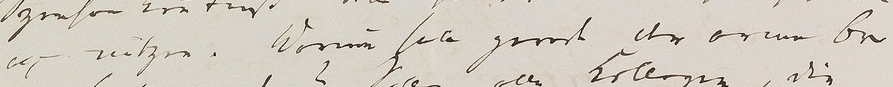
als nützen. Warum soll gerade der arme Br
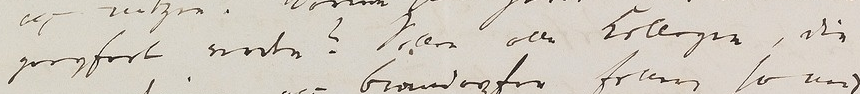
geopfert werden? Sollen alle Kollegen, die
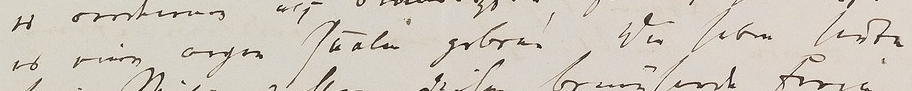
es einen argen Qualm geben! Wir haben heute
